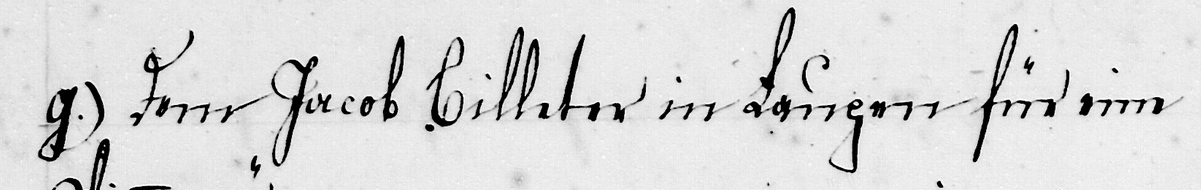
g.) Dem Jacob Billeter in Laupen für eine
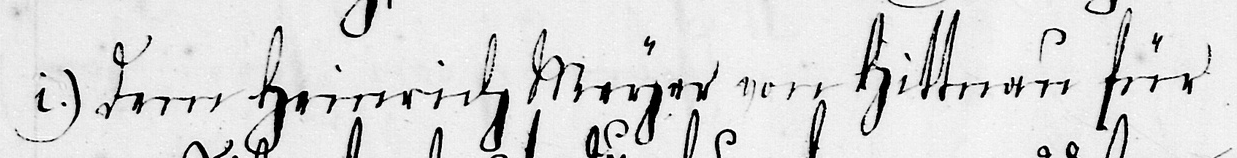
i.) Dem Heinrich Meyer von Hittnau für
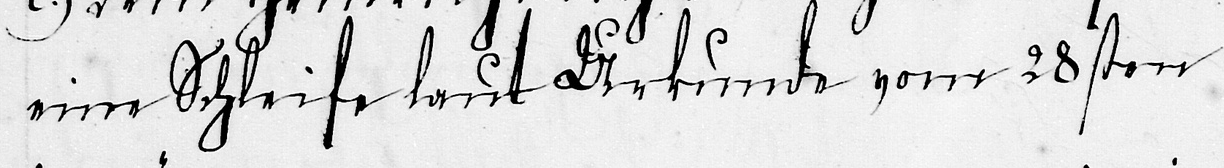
eine Schleife laut Urkunde vom 28sten
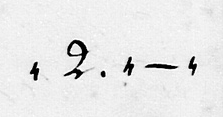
2. “ –
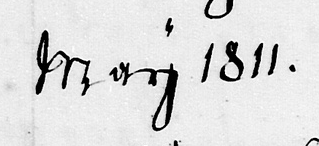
März 1811.
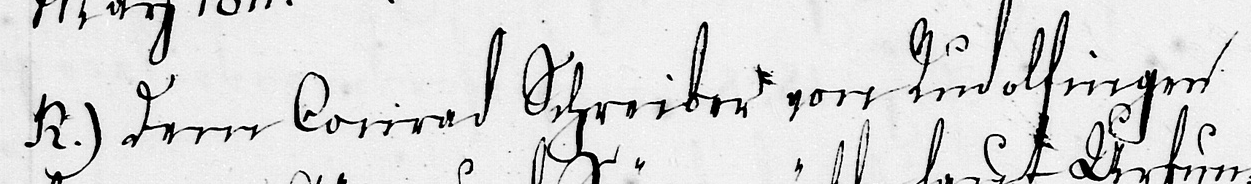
k.) Dem Conrad Schreiber von Rudolfingen
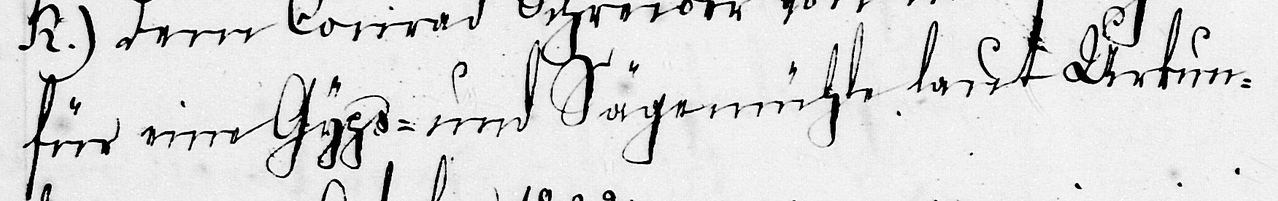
für eine Gyps- und Sägemühle laut Urkun¬
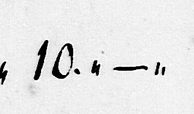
10. “ –
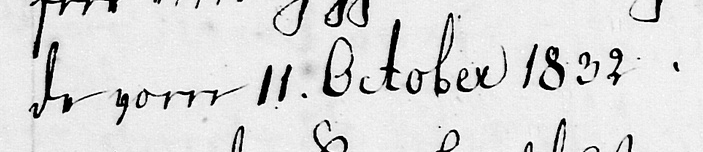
de vom 11. October 1832.
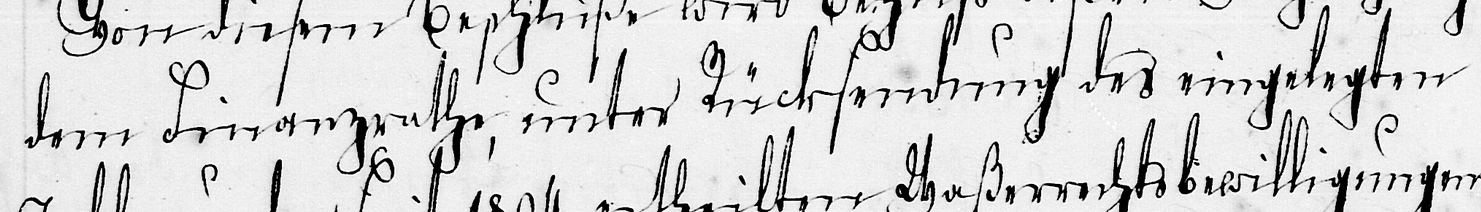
dem Finanzrathe, unter Rückforderung des eingelegten
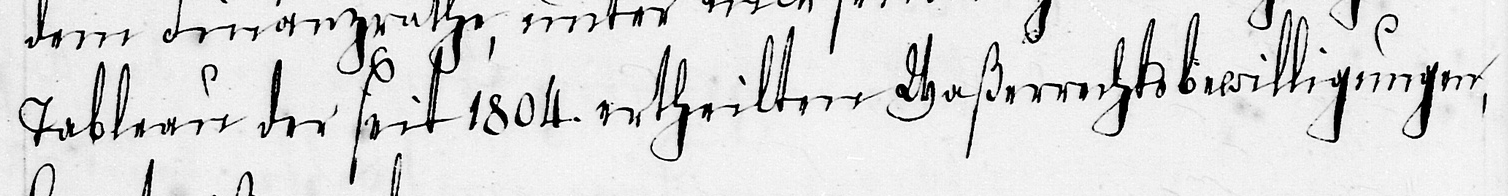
Tableau der seit 1804. ertheilten Waßerrechtsbewilligungen,
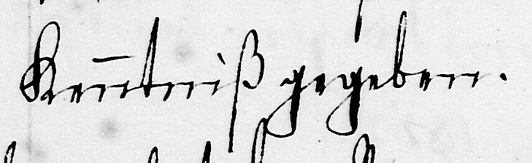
Kenntniß gegeben.
